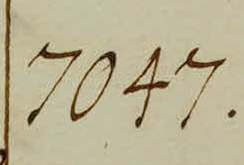7047
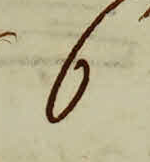6
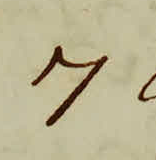7
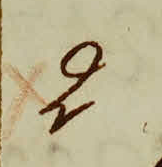2
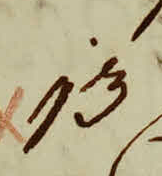13
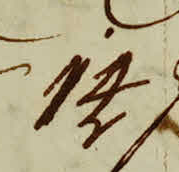14
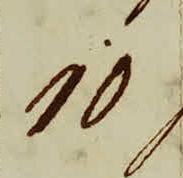10
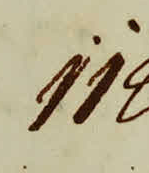11
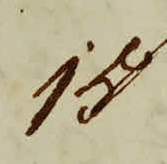15
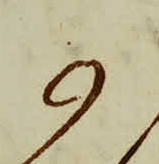9
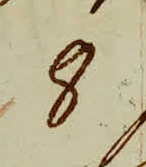8
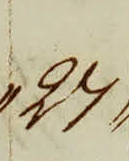27
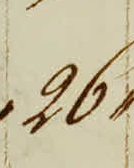26
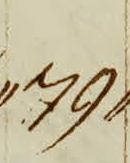79
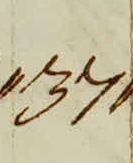37
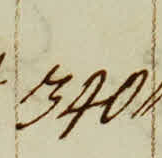340
